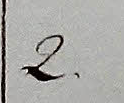2.
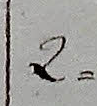2
